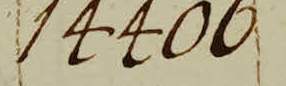14406
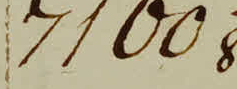7160
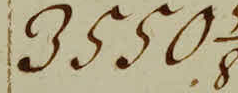3550
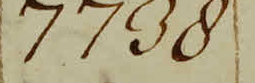7738
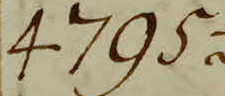4795
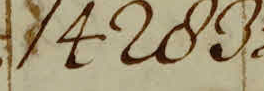14283
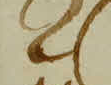2
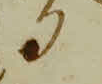3
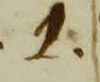1.
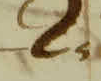2
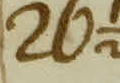26
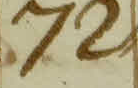72
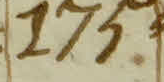175
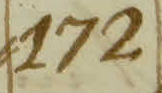172
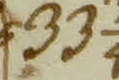33
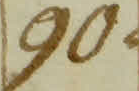90
